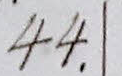44.
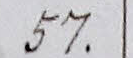57.
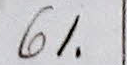61.
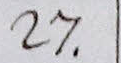27.
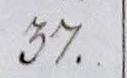37.
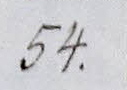54.
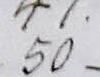50
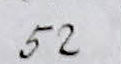52
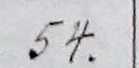54.
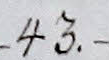43.
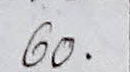60.
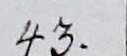43.
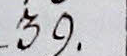39.
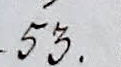53.
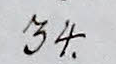34.
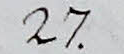27.
